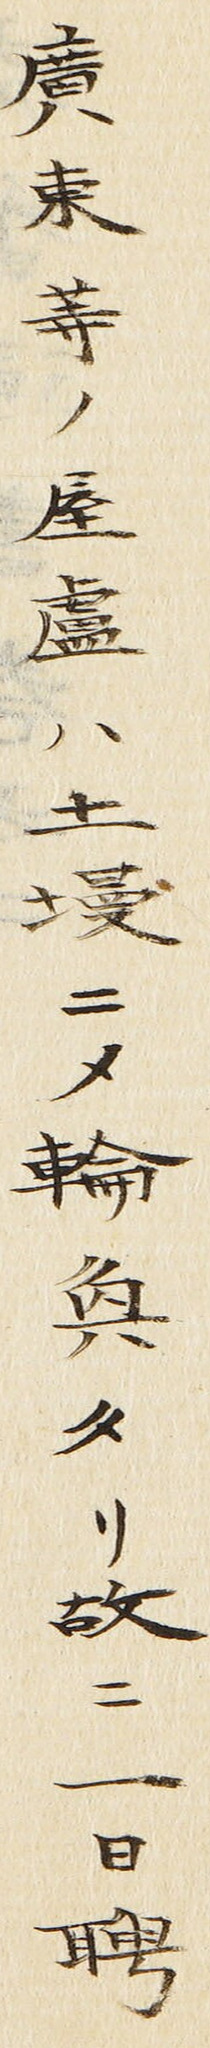広東䓁ノ屋盧ハ土墁ニシテ輪奐タリ故ニ一日聘
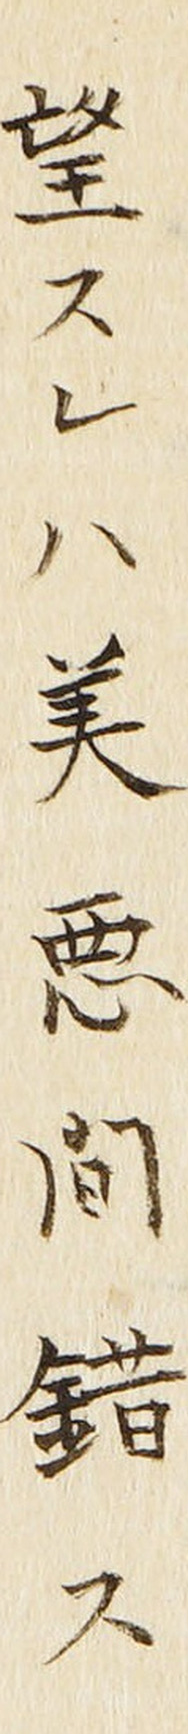望スレハ美悪間錯ス

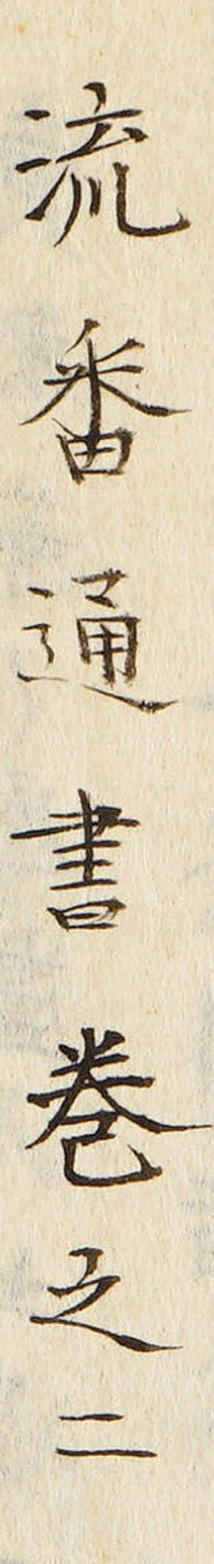流番通書巻之二

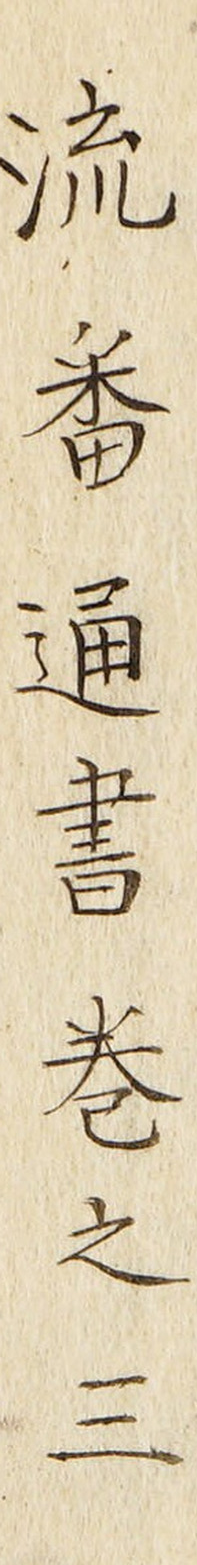流番通書巻之三
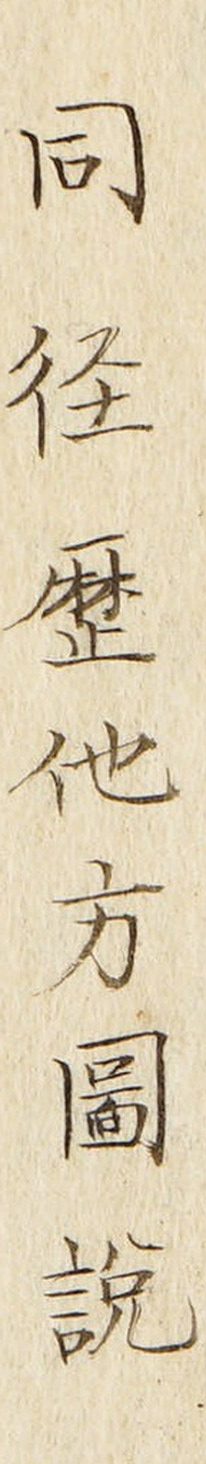同径歴他方図説
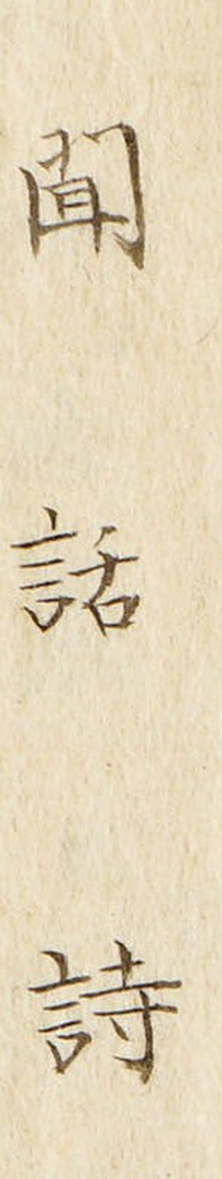聞話詩

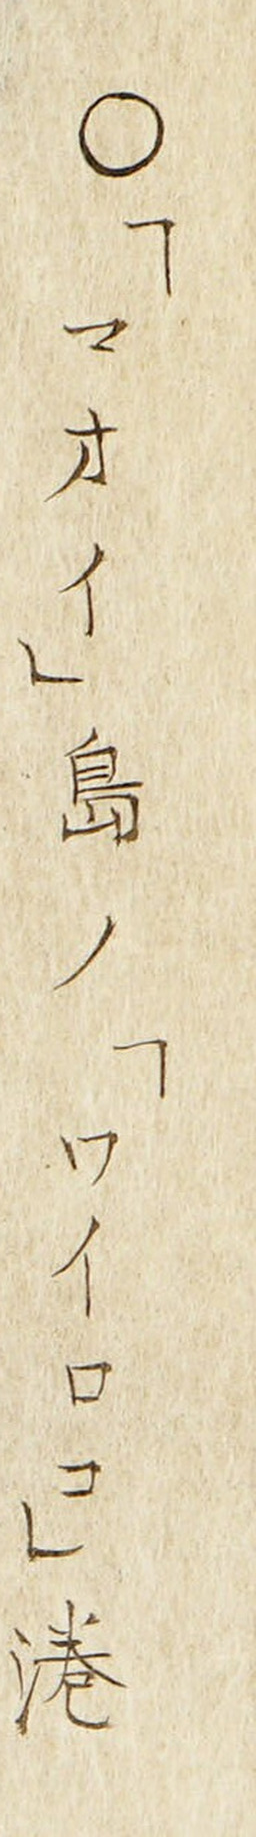○「マオイ」島ノ「ワイロコ」港

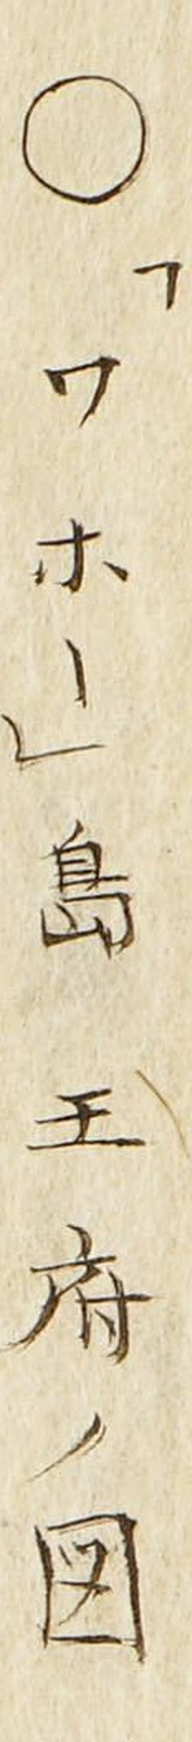○「ワホー」島王府ノ図

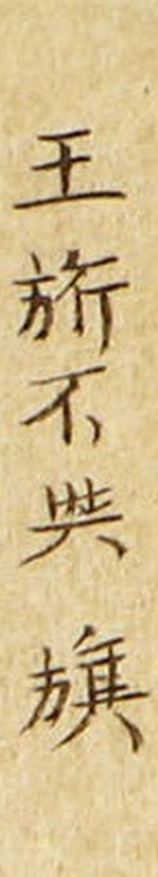王旂不典旗
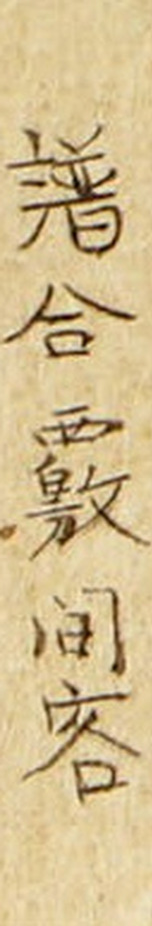譜合覈間客
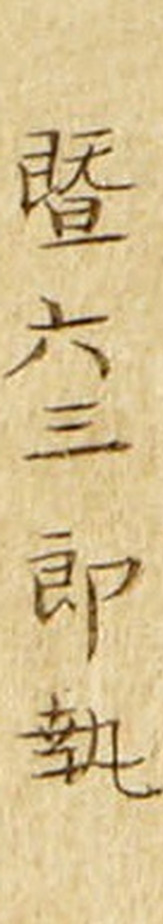曁六三郎執
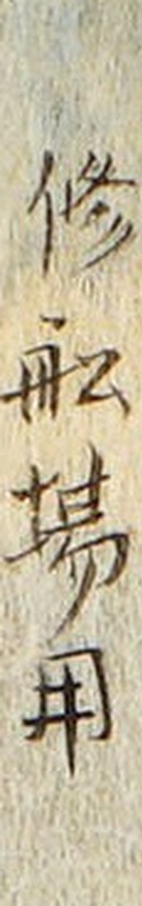修船場用
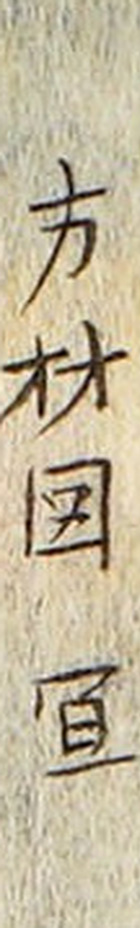方材図冝
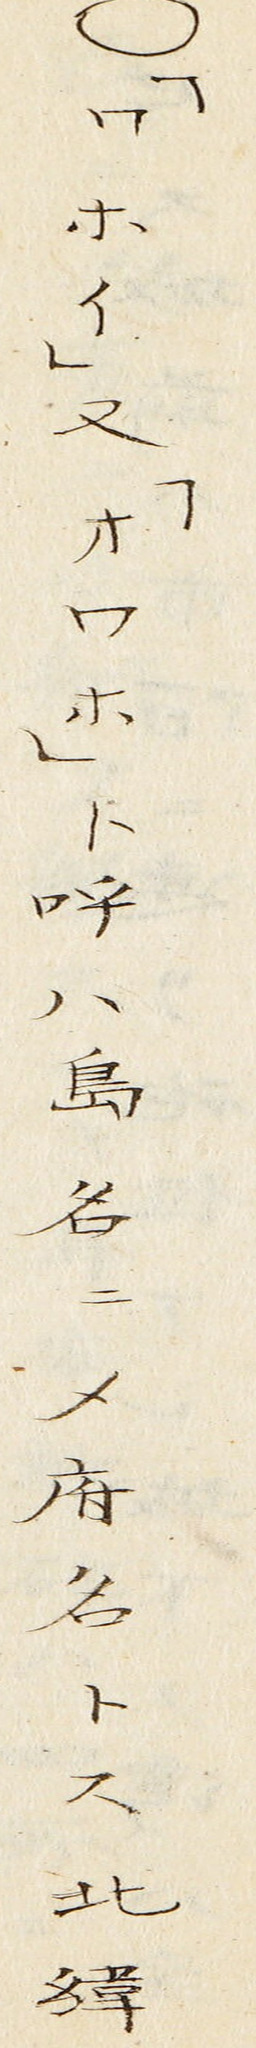○「ワホイ」又「オワホ」ト呼ハ島名ニシテ府名トス北緯
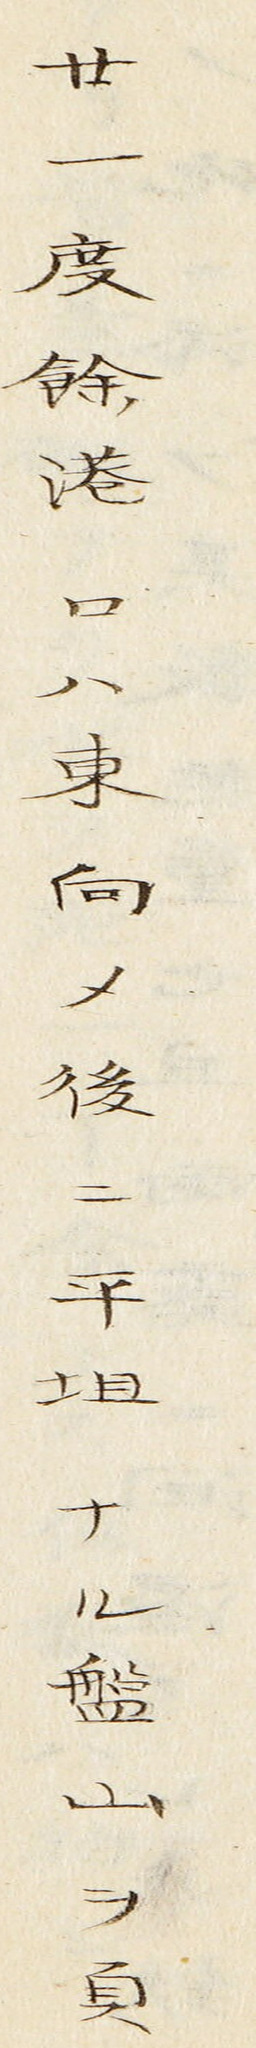廿一度余港口ハ東向シテ後ニ平坦ナル盤山ヲ負
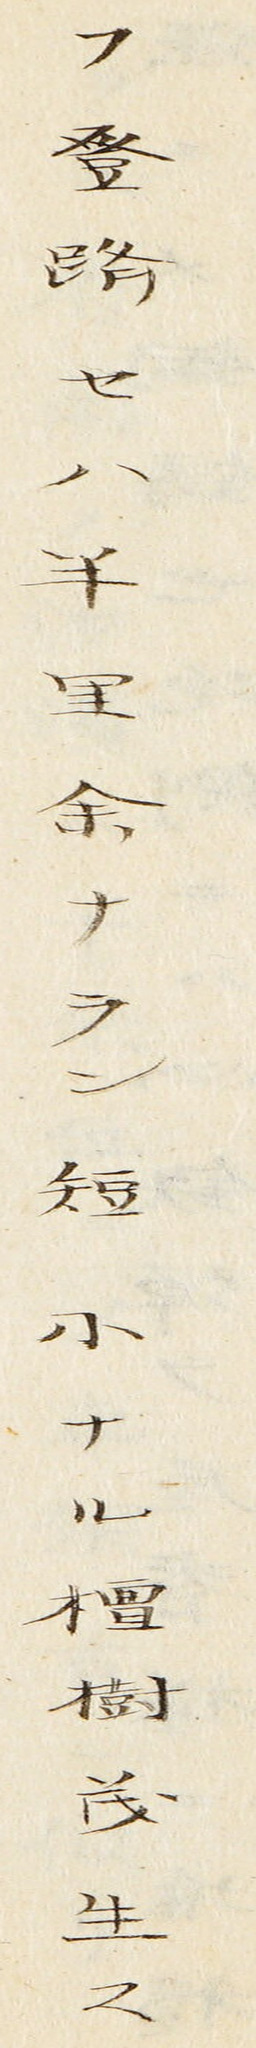フ登跨セハ半里余ナラン短小ナル檀樹茂生ス
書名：流蕃通書
